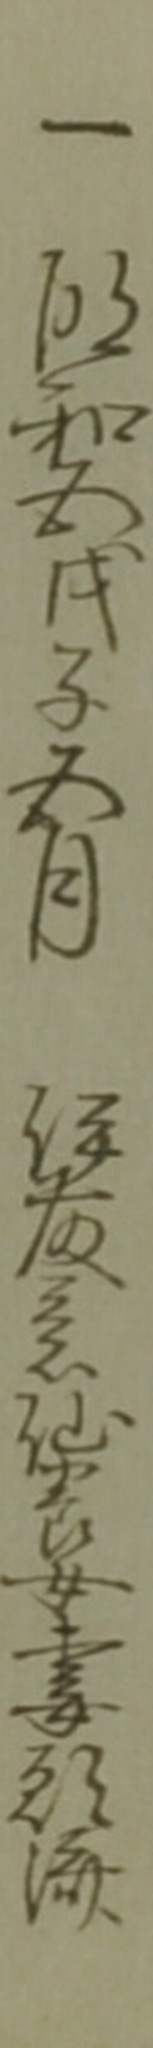一明和五戊子五月伊藤意仙養女妻願済
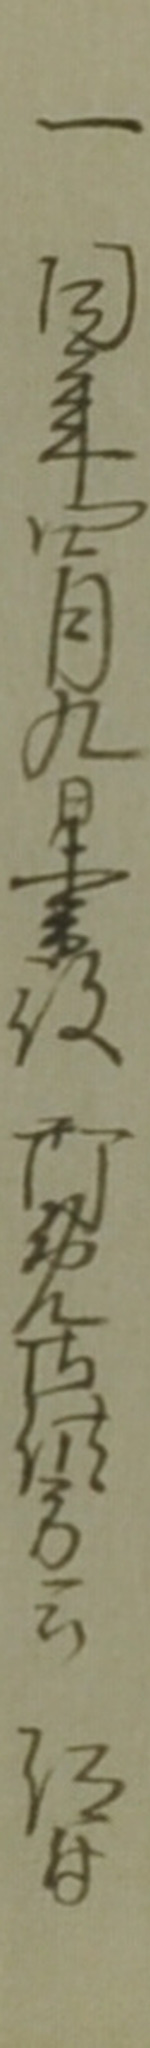一同年四月九日書役御免御供方被仰付
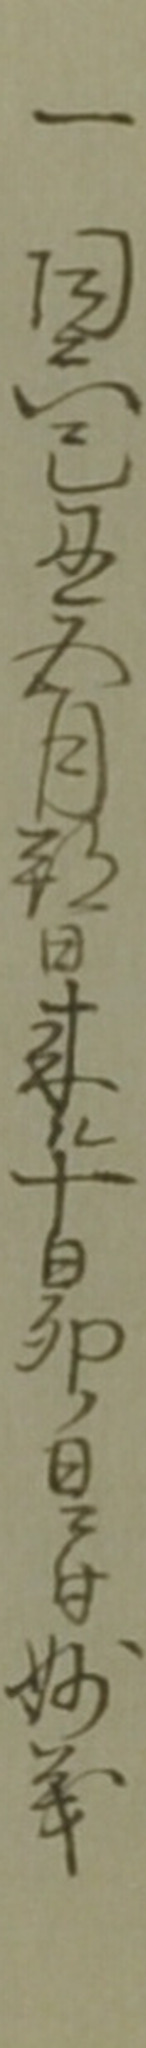一同六己丑五月朔日来十日卯日ニ付妙義
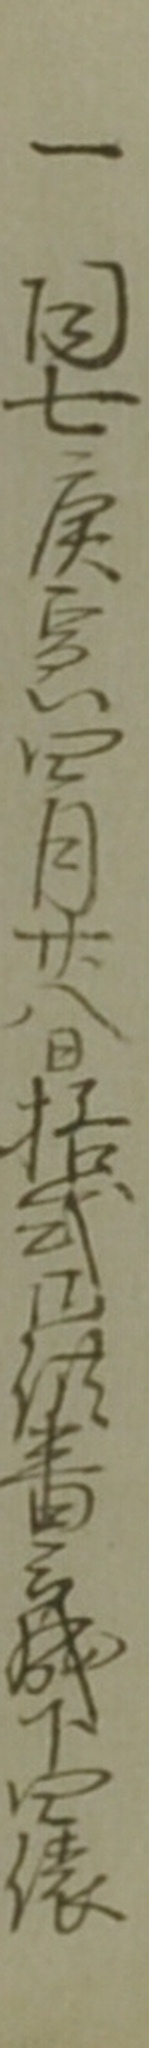一同七庚寅四月廿八日格式御供番被成下四俵
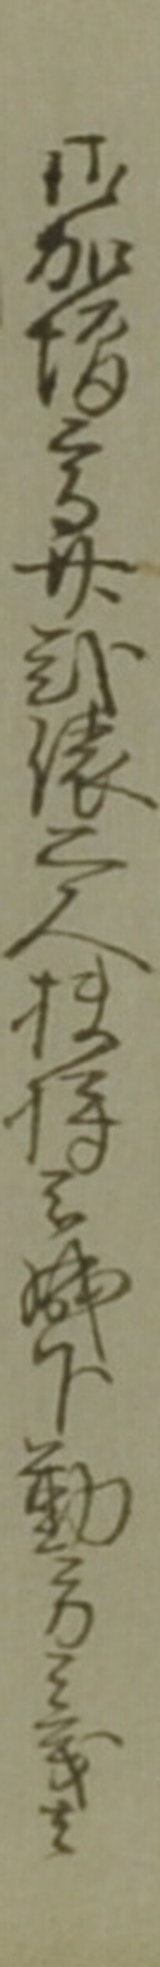御加増高廿弐俵二人扶持被成下勤方之義者
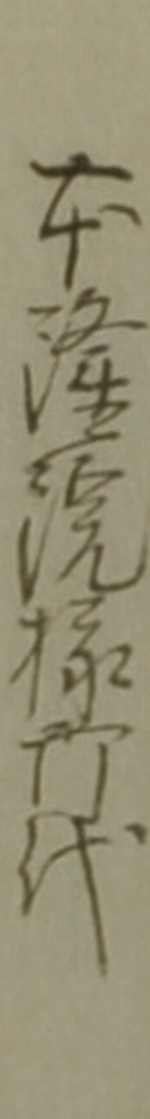本隆院様御代
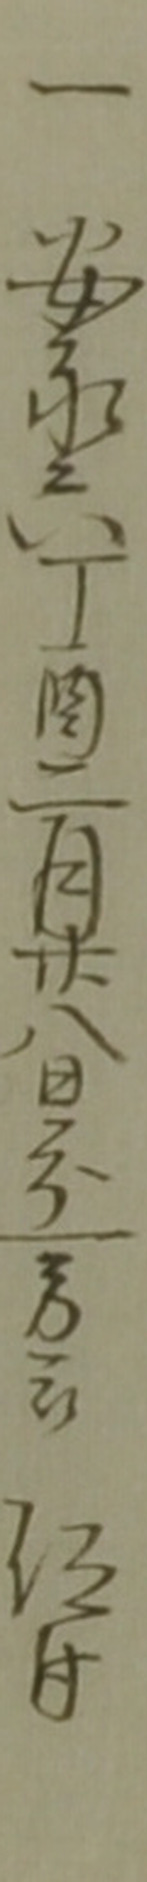一安永六丁酉二月廿八日分一方被仰付
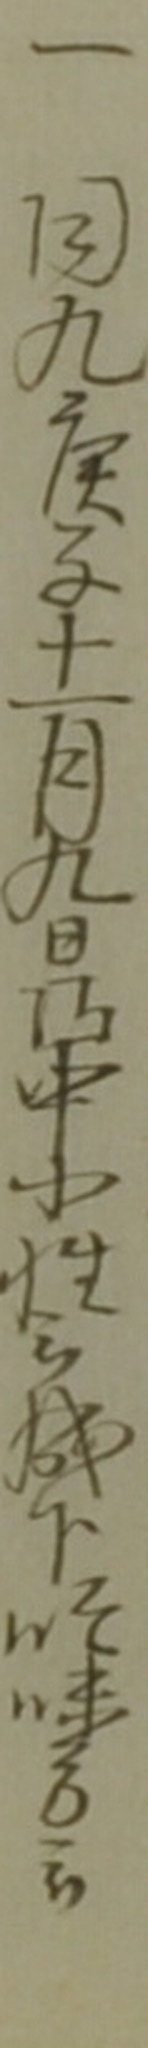一同九庚子十一月九日御中小性被成下吟味方被
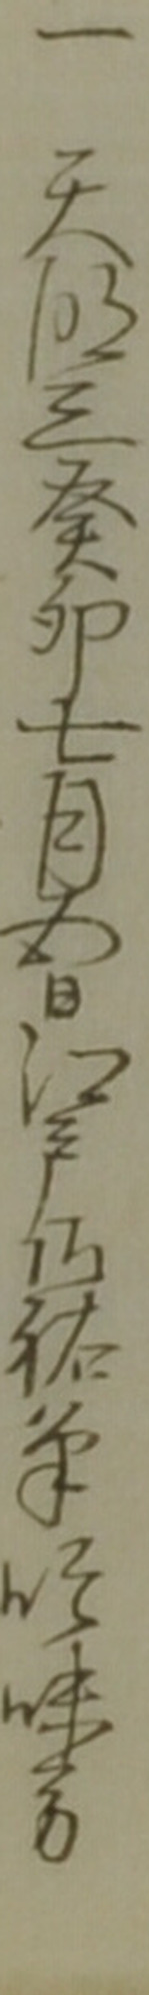一天明三癸卯七月五日江戸御祐筆吟味方
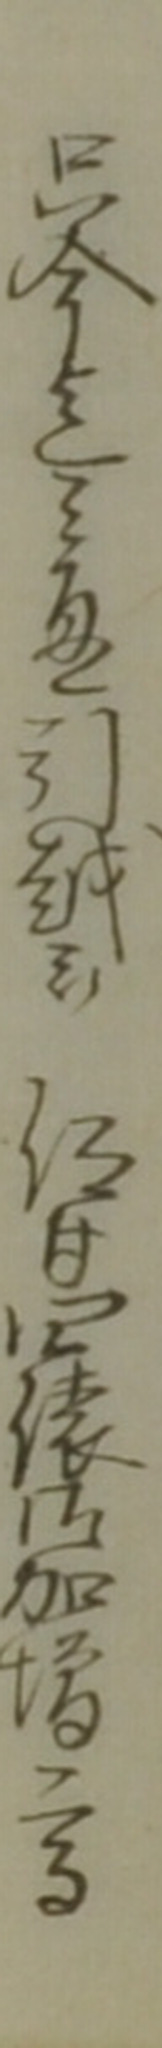只今迄之通引越被仰付四俵御加増高
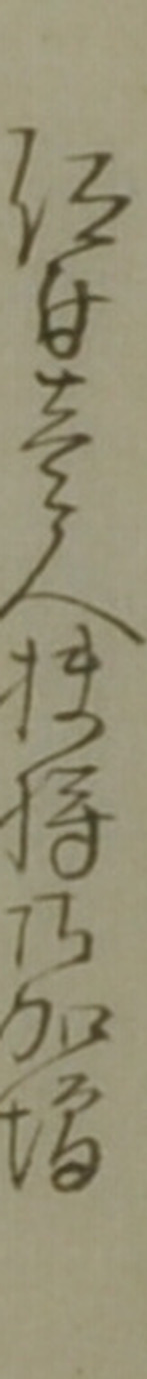仰付壱人扶持御加増
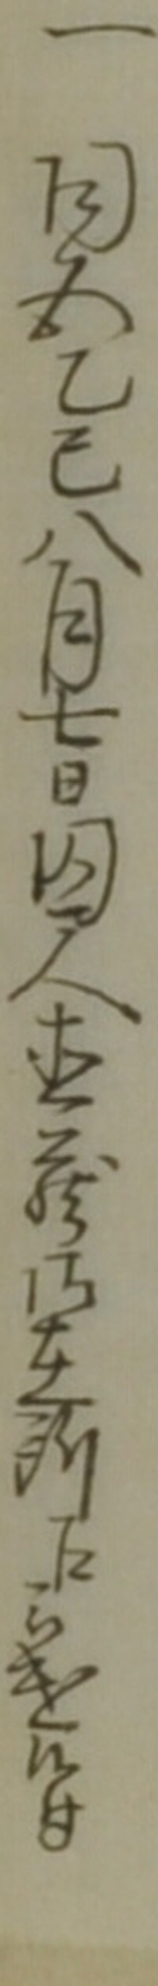一同五乙巳八月七日囚人直蔵御在所江被遣候付
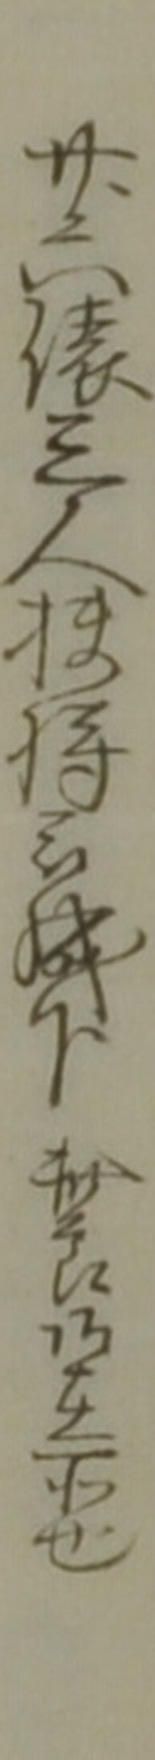廿六俵三人扶持被成下此節御在所也
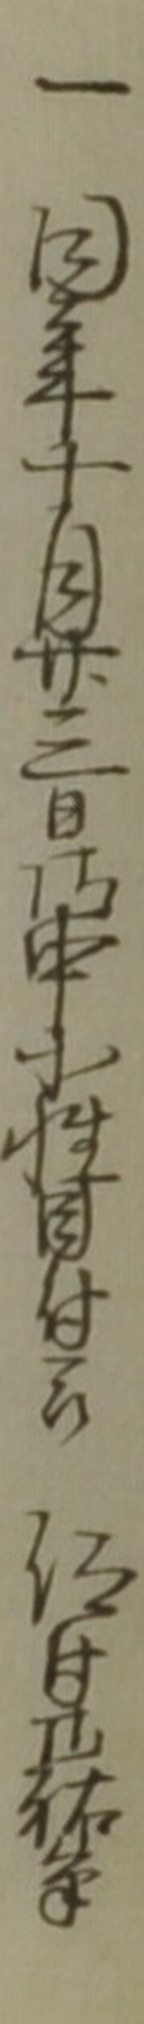一同年十月廿三日御中小性目付被仰付御祐筆
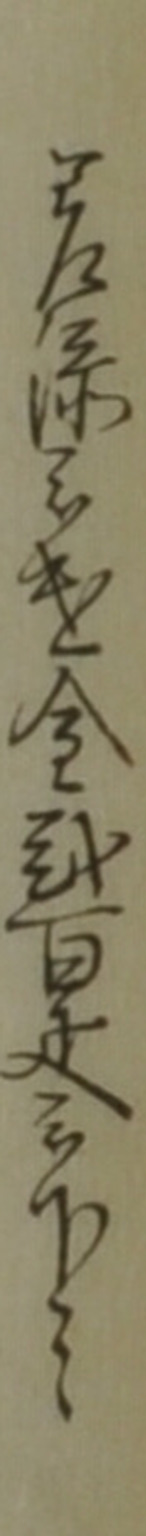差添被遣金弐百疋被下之
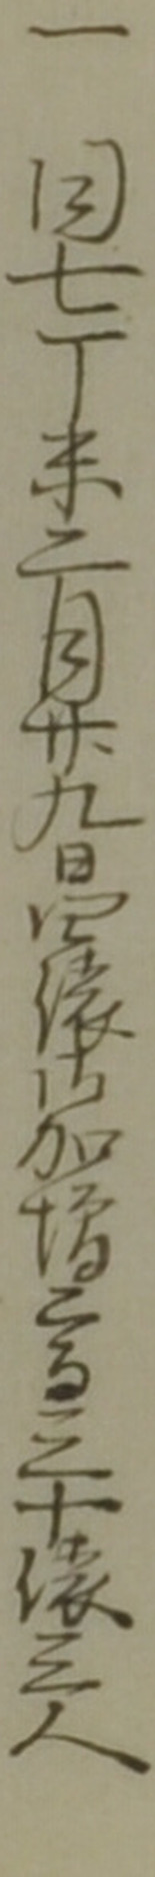一同七丁未二月廿九日四俵御加増高三十俵三人
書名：無足廃家（弐）
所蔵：伊那市立高遠町図書館・合同会社AMANE
